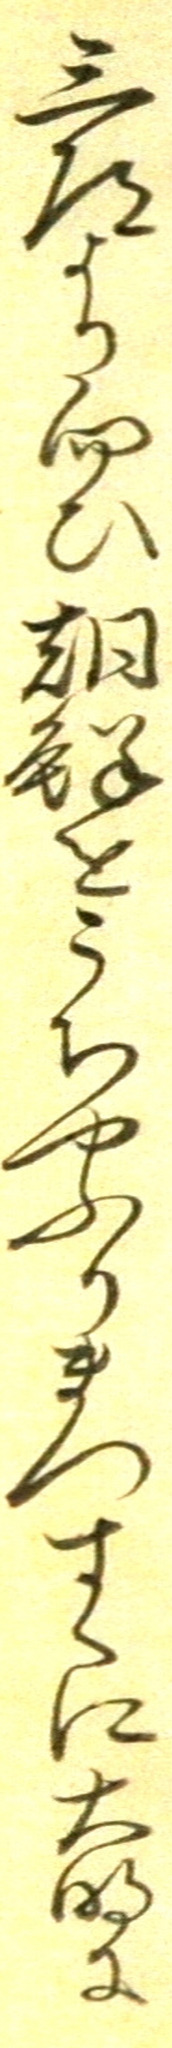三道より向ひ朝鮮をうちやふりまつすくに大明に

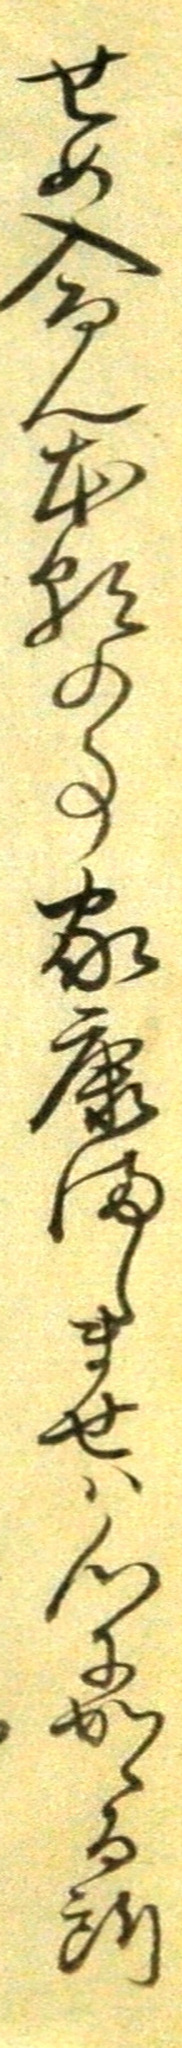せめ入なん本朝の事家康ましませは心にかゝる所
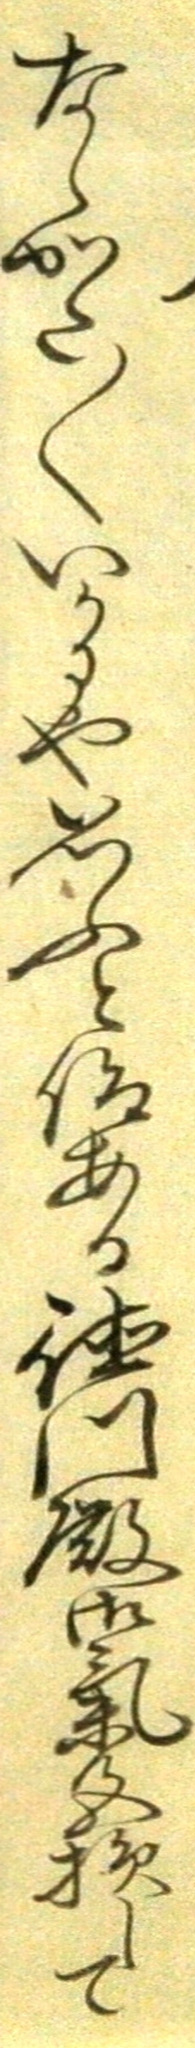なしかた〳〵いかにや思ふと仰ある徳川殿御気色損して
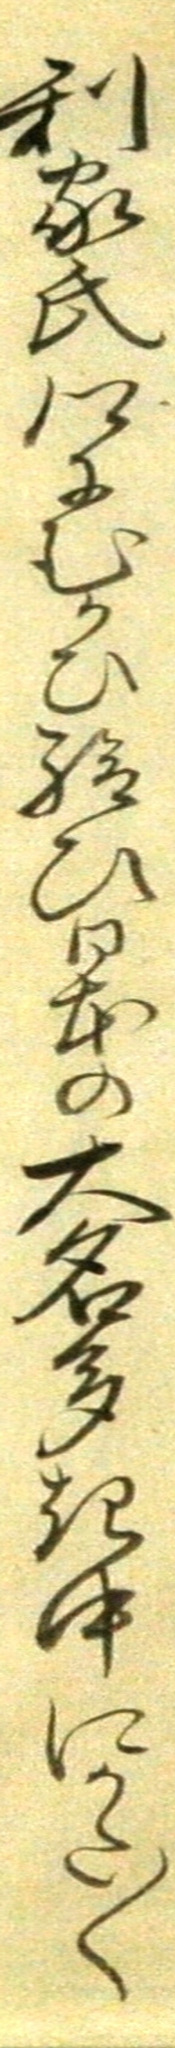利家氏郷にむかひ給ひ日本の大名多き中にかた〳〵
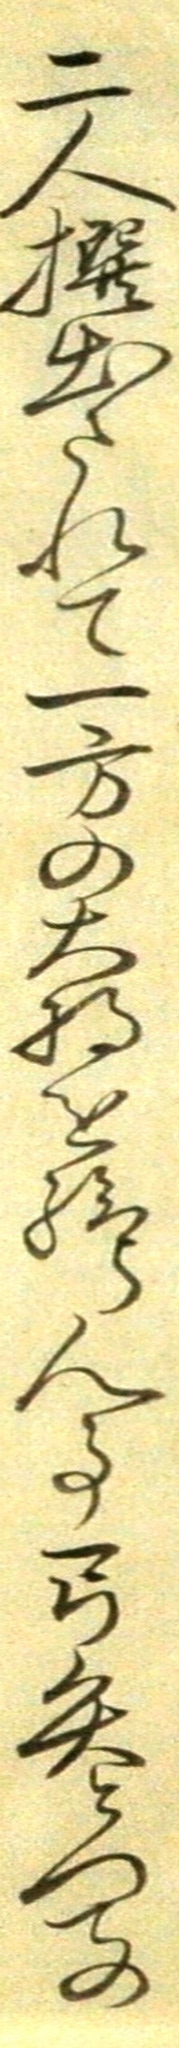二人撰出されて一方の大将を給らん事弓矢とつての
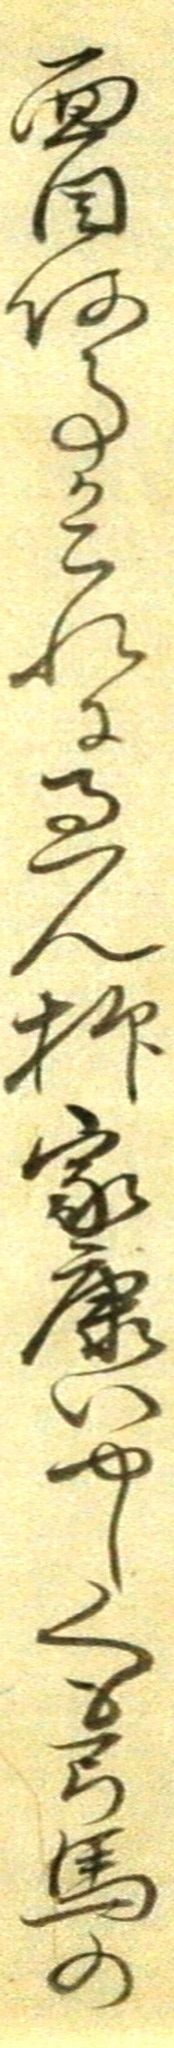面目何事かこれに過ん抑家康いやしくも弓馬の
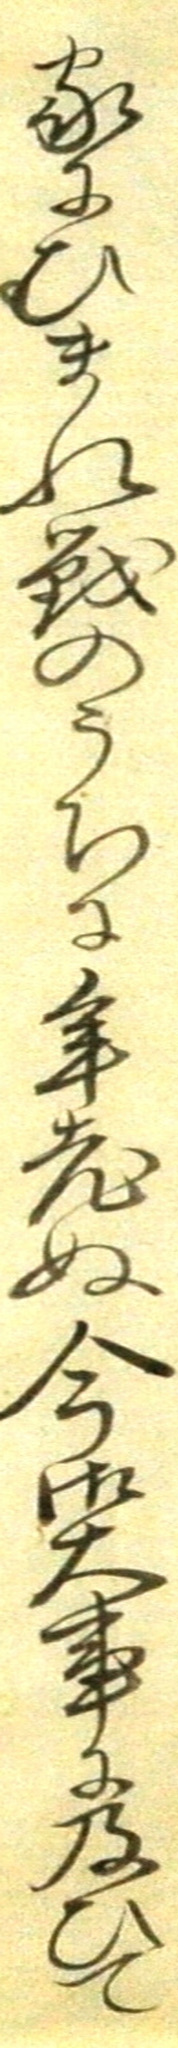家にむまれ戦のうちに年老ぬ今御大事に及ひて
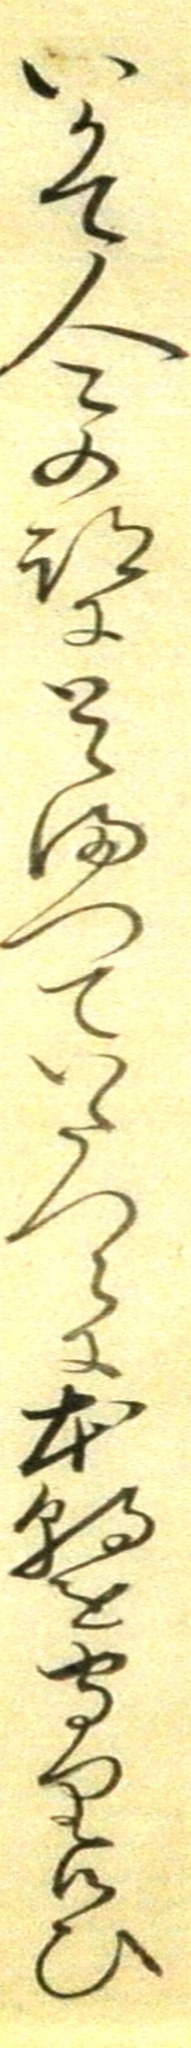いかて人々の跡にとゝまつていたつらに本朝を守り候ひ
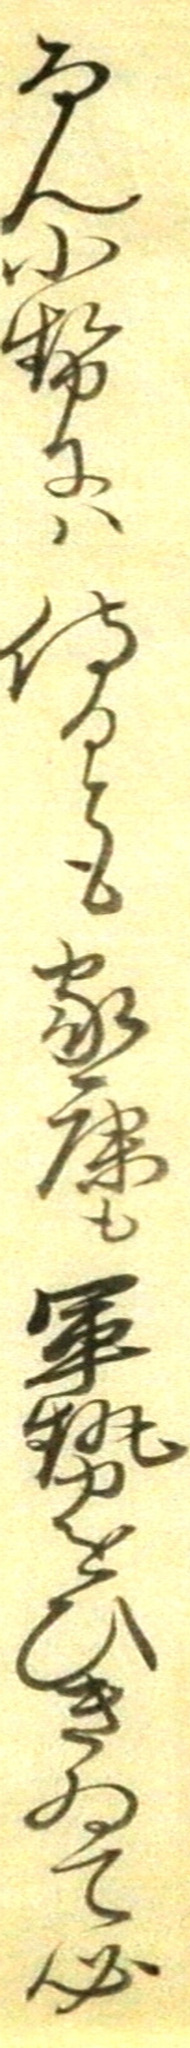なん小勢には侍るとも家康も軍勢をひきゐて必
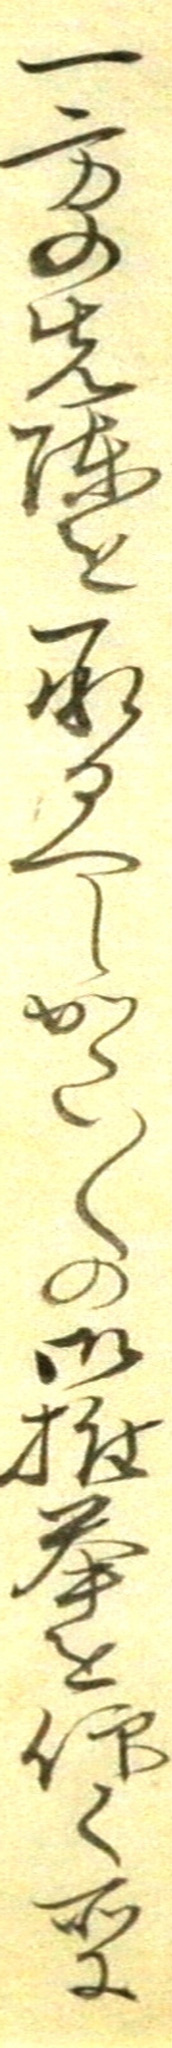一方の先陣を承るへしかた〳〵の御推挙を仰く所に
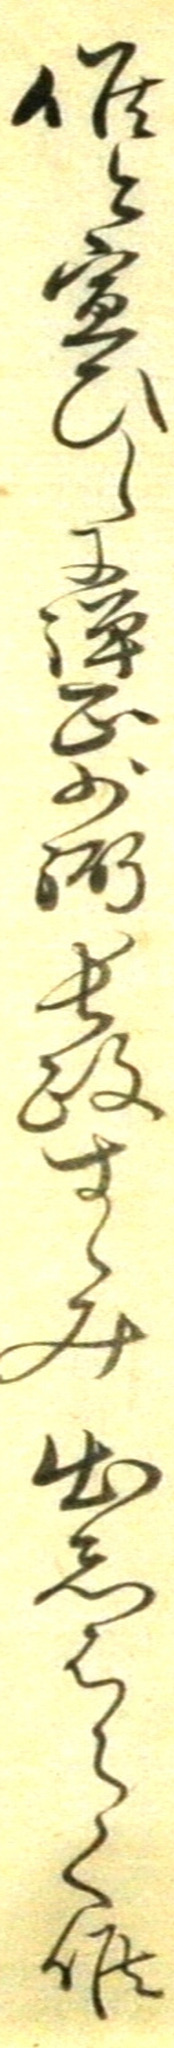候と宣ひしに弾正少弼長政すゝみ出しはらく候
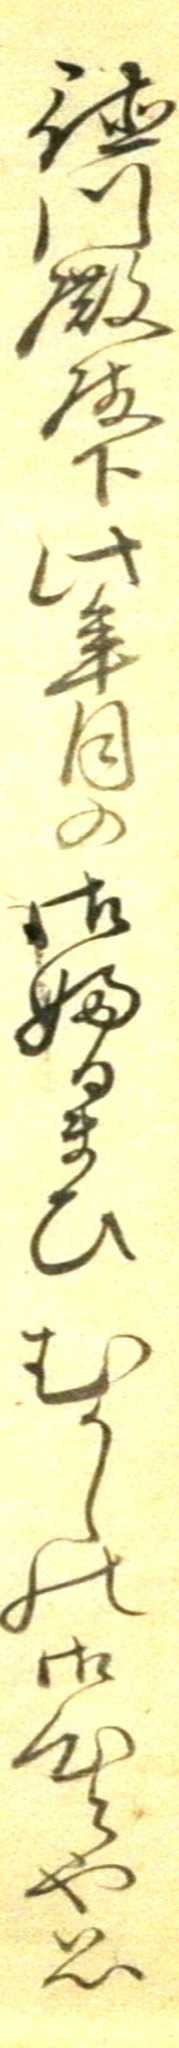徳川殿殿下此年月の御ふるまひむかしの御心とや思
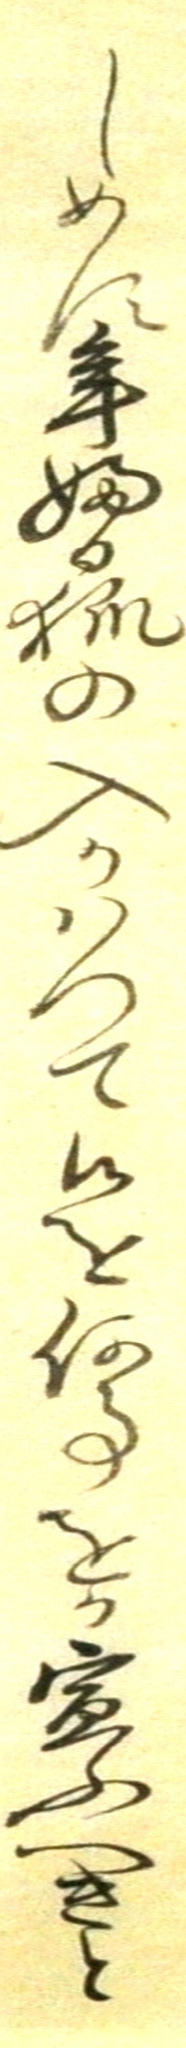しめす年ふる狐の入かはつて候を何事をか宣ふへきと
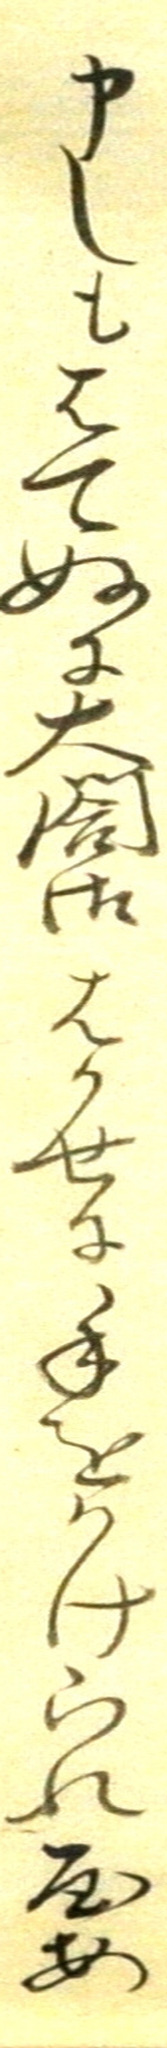申しもはてぬに太閤御はかせに手をかけられやあ
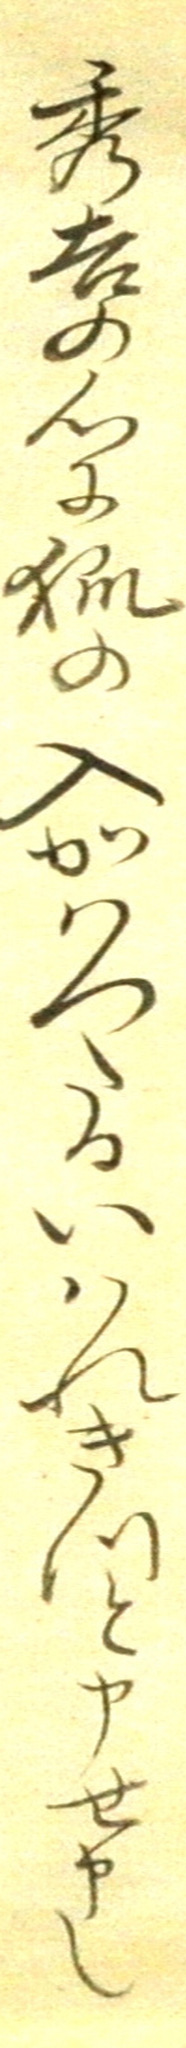秀吉の心に狐の入かはつたるいはれきつと申せ申し
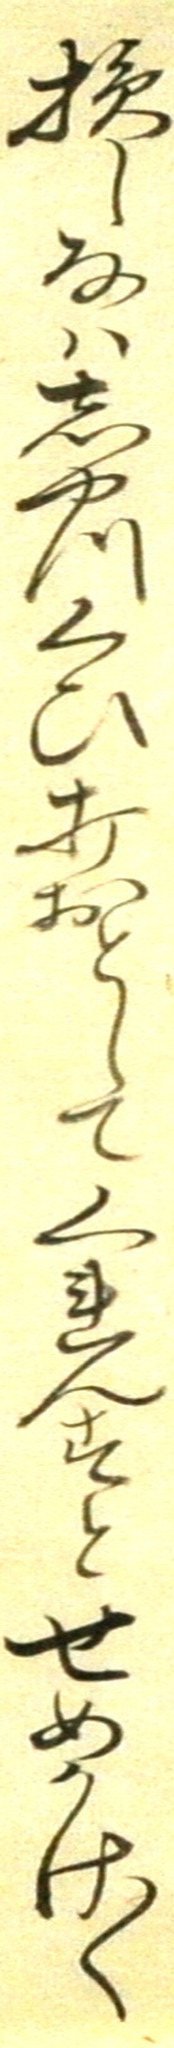損しなはしやつくひ打おとしてくれんすとせめかけ〳〵
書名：藩翰譜（七・上）
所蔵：伊那市立高遠町図書館・合同会社AMANE
